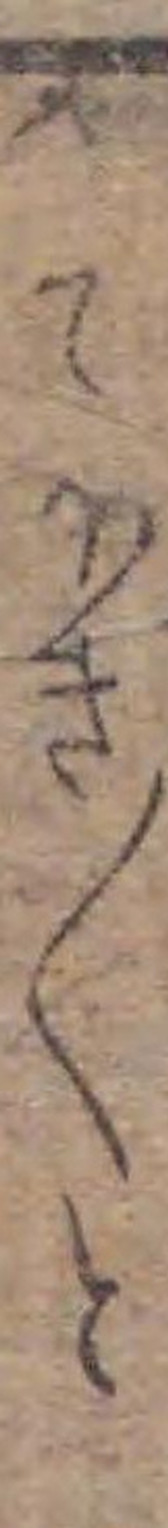にてほき〳〵と
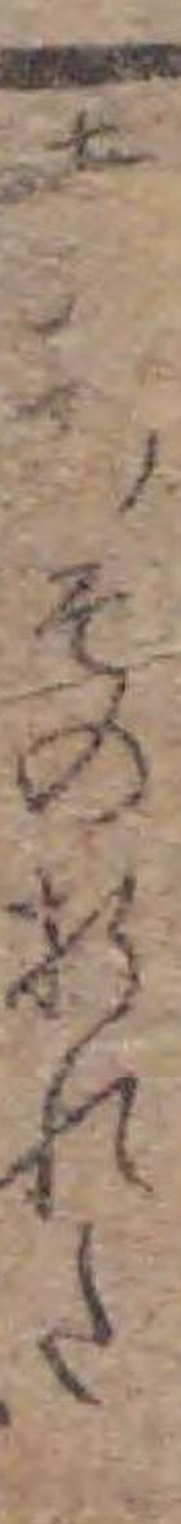その折れた
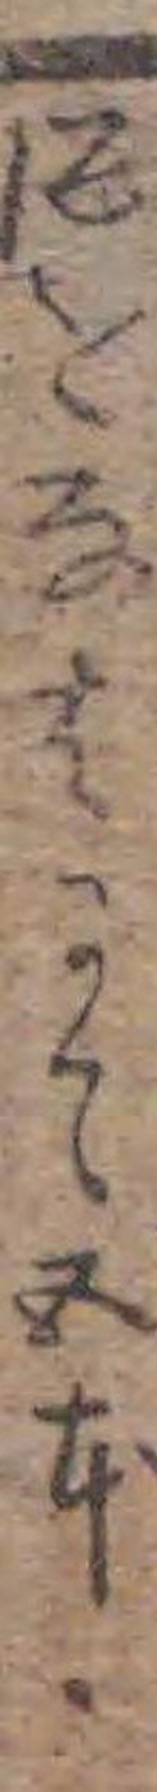酒をなはにて五本
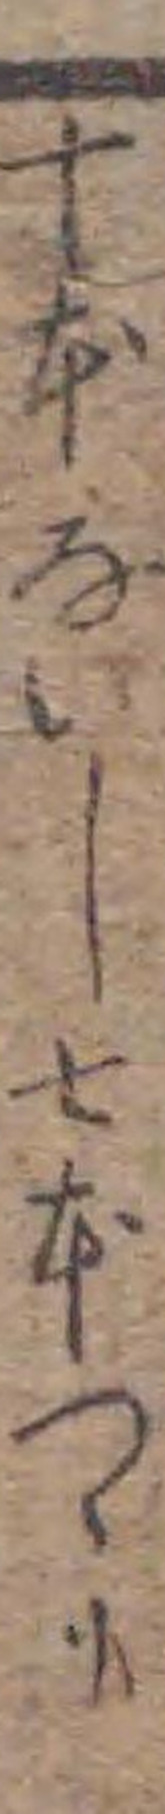十本ないし七本づゝも
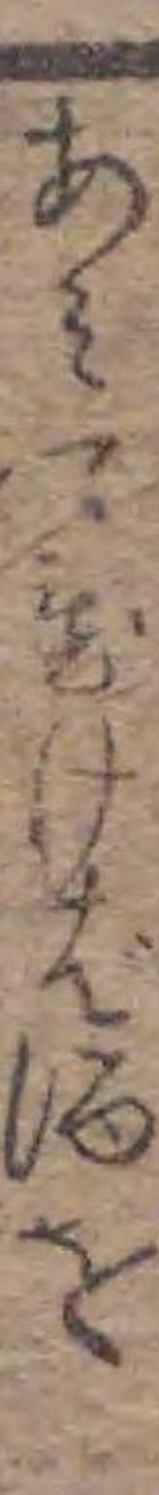あみて置けば酒を
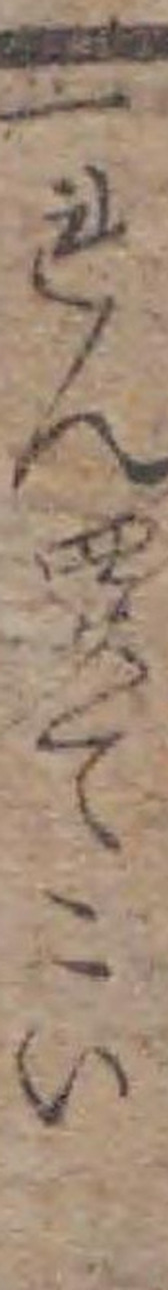一れん買てこい
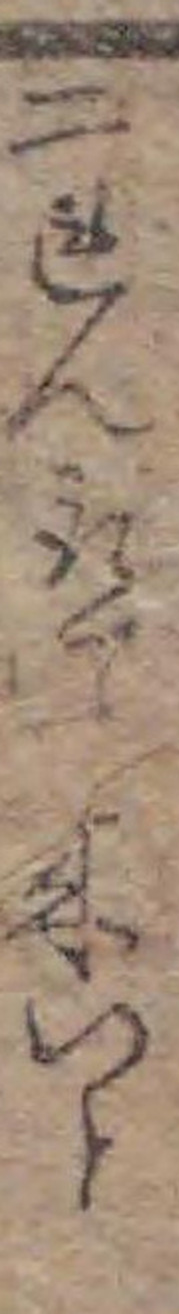二れん取てこいと
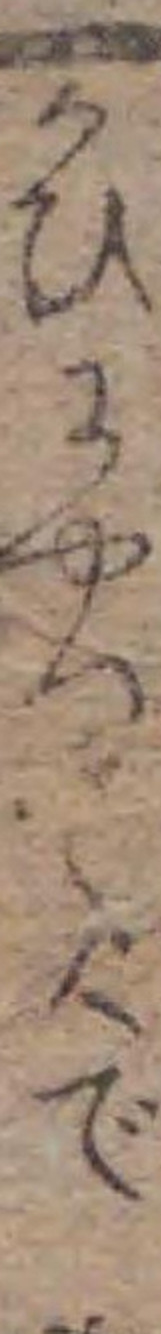かひにやつて火で
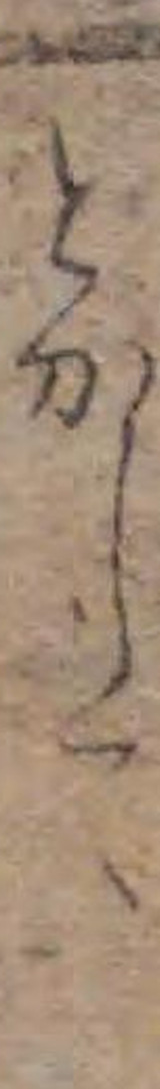とかして
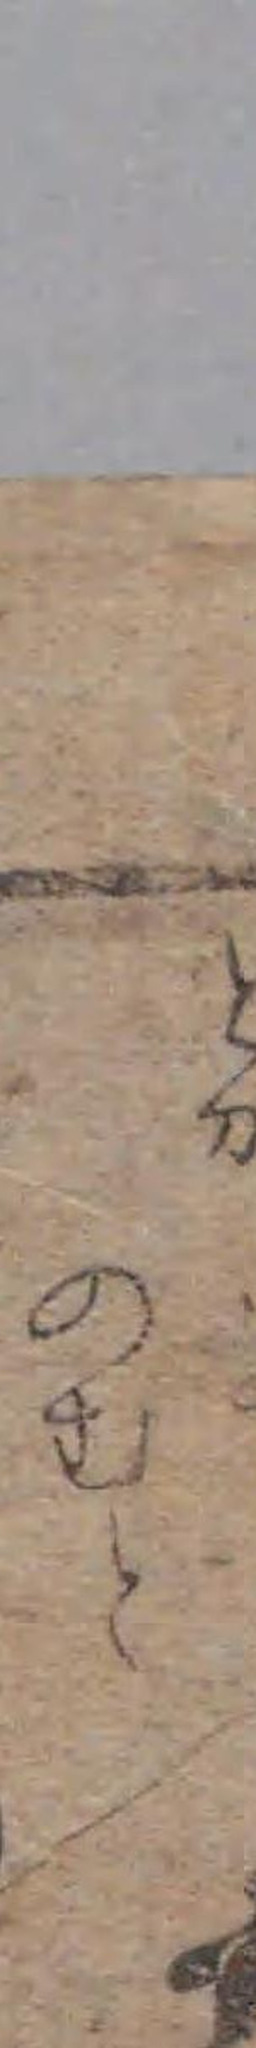のむと
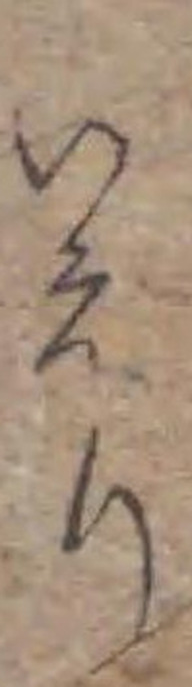いえり
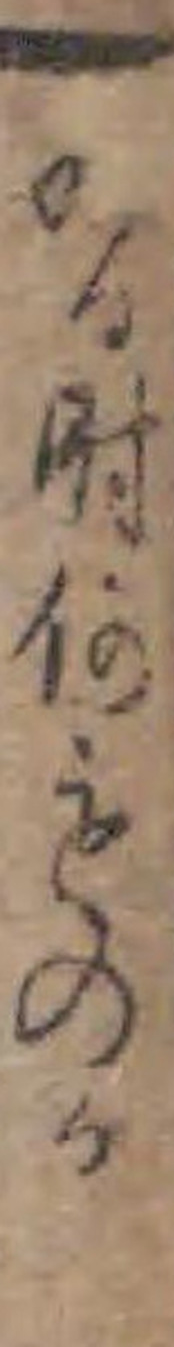ある時何ものか
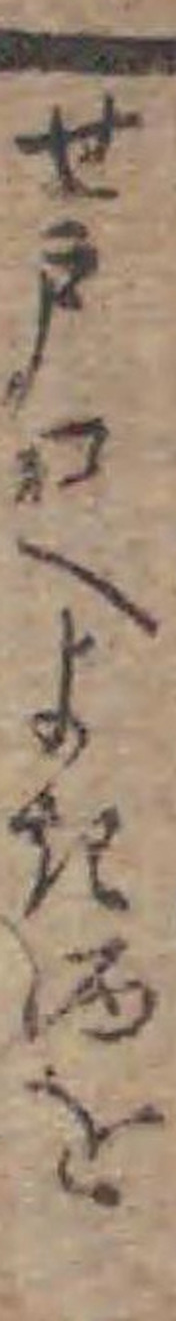せ戸口へよき酒を
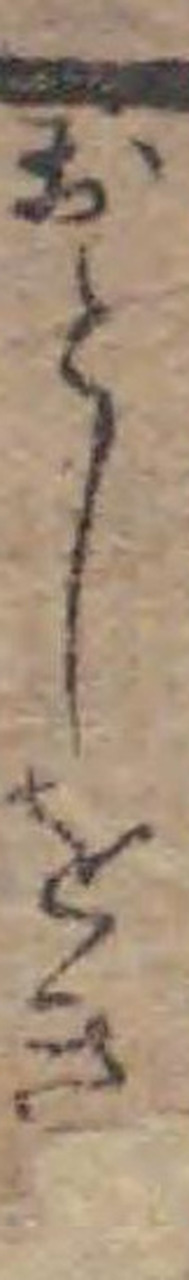おとしをき
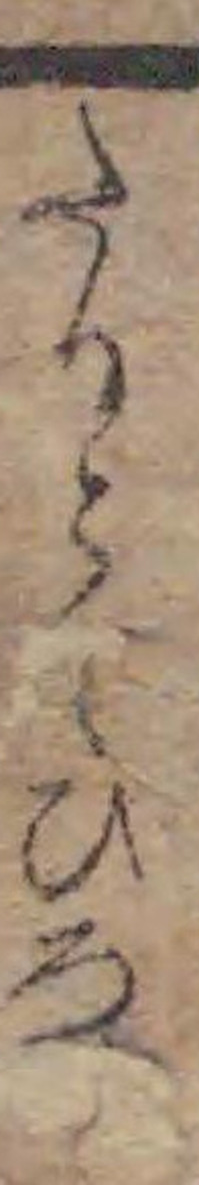たりとひろ
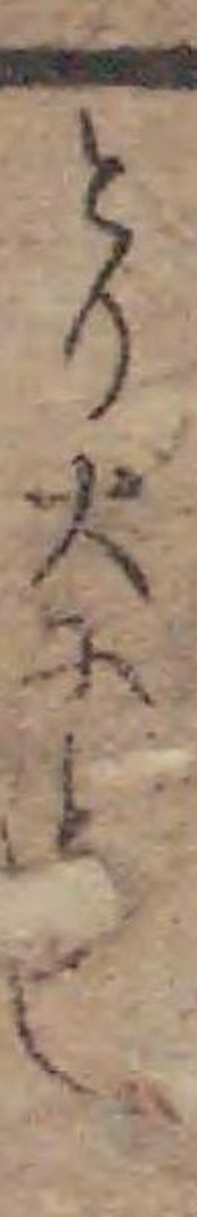とり火にとし
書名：虚言八百万八伝 : 3巻
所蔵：国立国会図書館 National Diet Library, JAPAN
